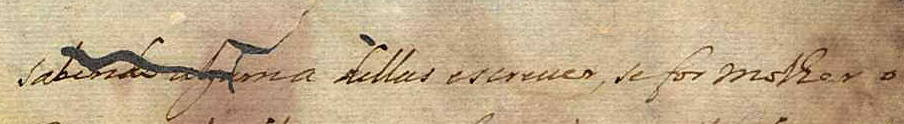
sabendo alguma dellas escreuer, se fot molher o
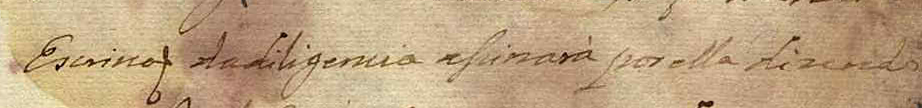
Escriuaõ da diligencia assinarà por ella dizendo
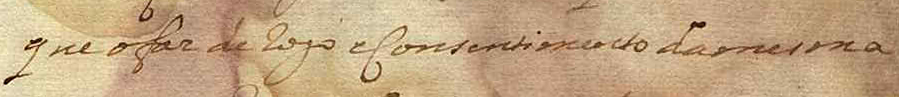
que o faz de Rogo e Consentimento da mesma
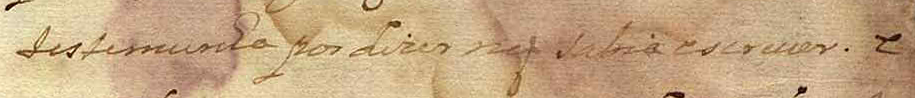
testemunha por dizer naõ sabia escreuer. E
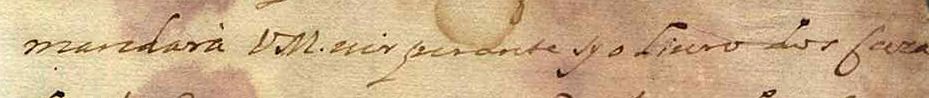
mandarà VM. uir perante sy o Liuro dos Caza
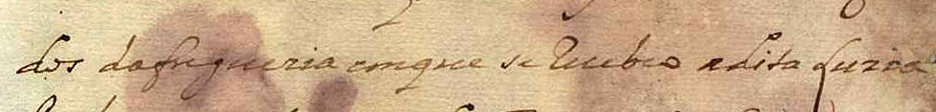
dos da freguezia em que se Recebeo a dita Luzia
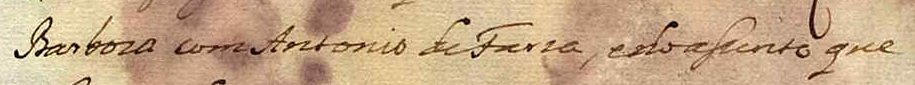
Barboza com Antonio de Faria, e do assento que
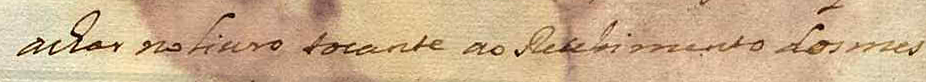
achar no liuro tocante ao Recebimento dos mes
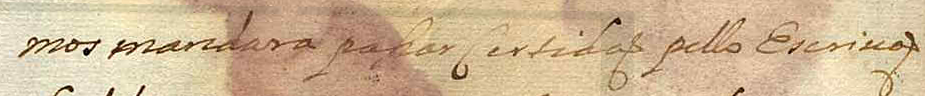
mos mandara passar Certidaõ pello Escriuaõ
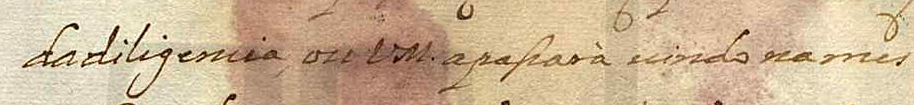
da diligencia, ou VM. a passarà uindo na mes
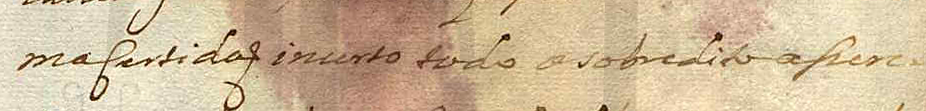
ma Certidaõ incerto todo o sobredito assen
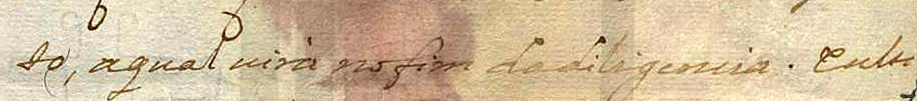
to, a qual uirà no fim da diligencia. E ulti
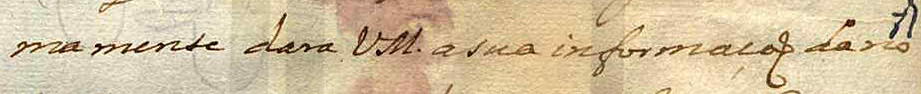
mamente dara VM. a sua informaçaõ da no
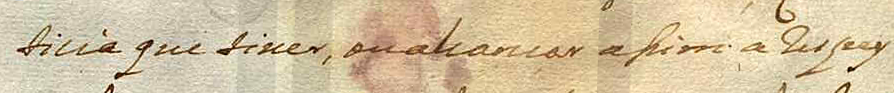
ticia que tiuer, ou alcançar assim a Respey
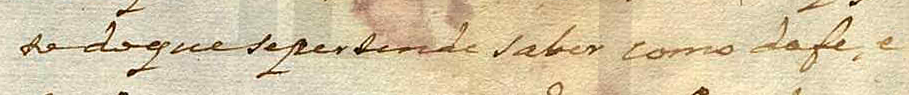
to do que se pertende saber como da fe, e
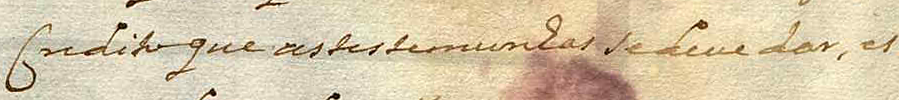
Credito que as testemunhas se deue dar, es
